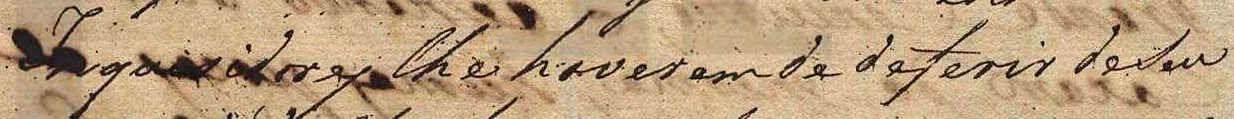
Inquisidores lhe haverem de deferir de Seu
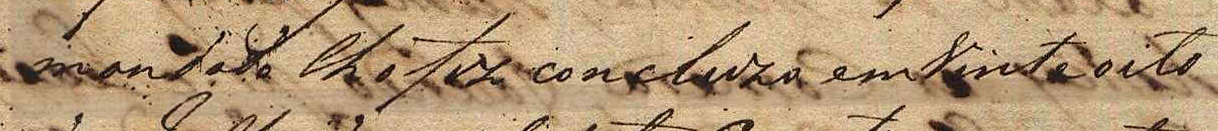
mandado lho fiz concluzo em Vinte oito
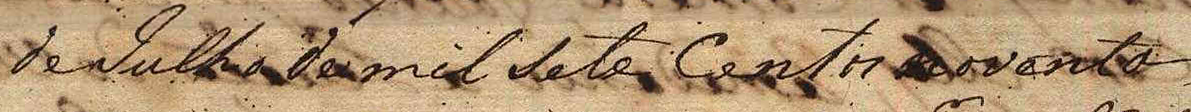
de Iulho de mil seteCentos noventa
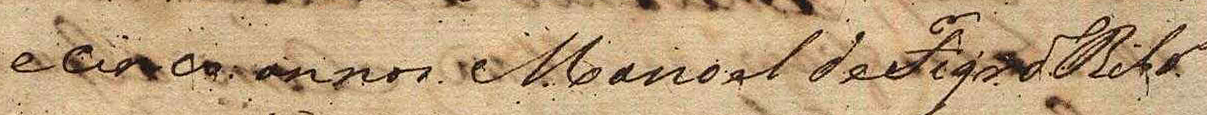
e cinco annos. e Manoel de Figrdo Ribr.o
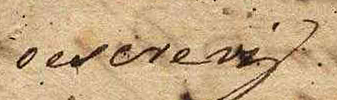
o escrevi
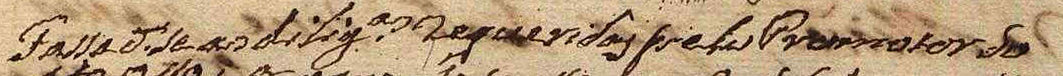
Fassaõ-se as dilig.as Requeridas pelo Promotor do
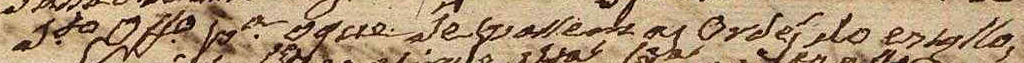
s.to Off.o p.a o que se passem as Ordẽs do estyllo,
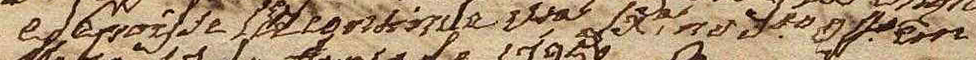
e depois se lhe continue v,ta Lx.a no S.to Off.o em
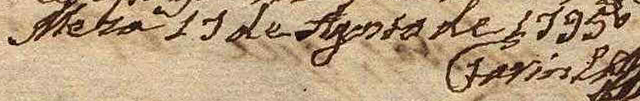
Meza 17 de Agosto de 1795
